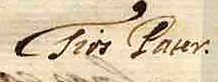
Tios Pater.
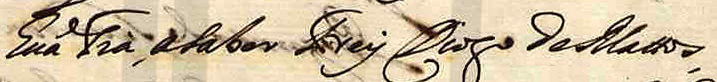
huā Tia, a saber Frey Diogo de Mattos,
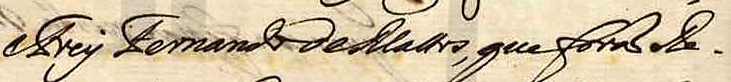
Frey Fernando de Mattos, que foraõ Re
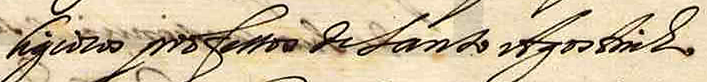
ligiozos professos de Santo Agostinho
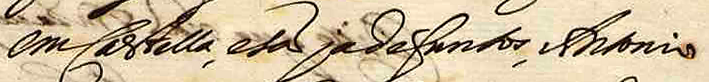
em Castella, e saõ já defuntos, Antonio
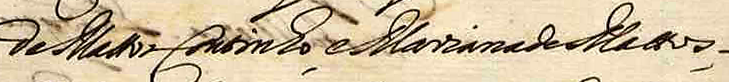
de Mattos Coutinho, e Mariana de Mattos,
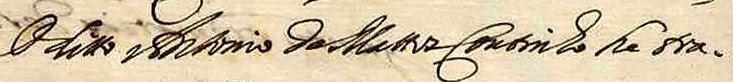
O ditto Antonio de Mattos Coutinho he tra
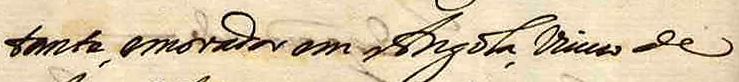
tante, e morador em Angola, viuuo de
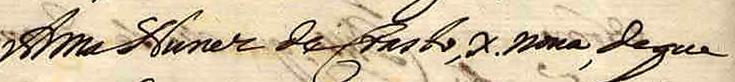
Anna Nunez de Mattos, x. noua, de que
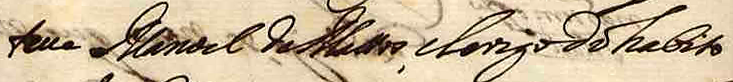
teue Manoel de Mattos, clerigo de habito
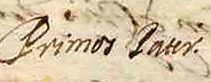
Primos Pater.
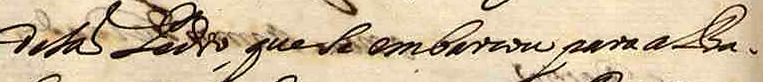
de saõ Pedro, que se embarcou para a Ba
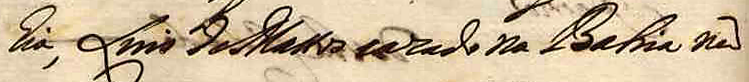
hia, Luis de Mattos cazado na Bahia naõ
